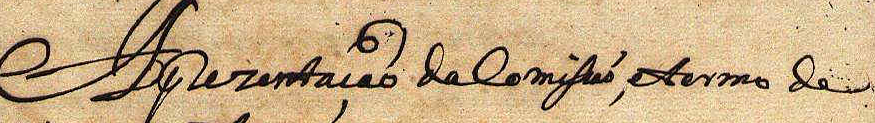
Aprezentaçaõ da Comissaõ, e termo de
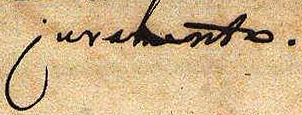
juramento.
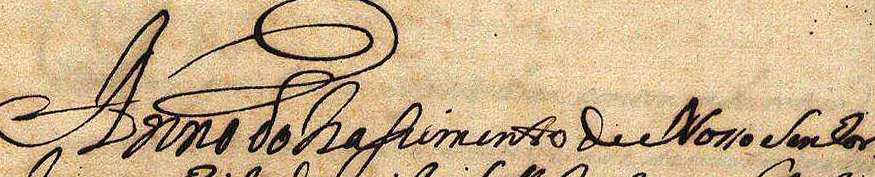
Anno do nascimento de Nosso Senhor
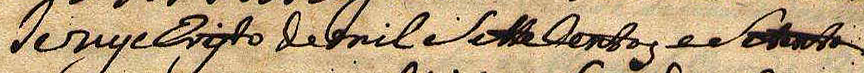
Iesus christo de mil SetteCentos e Setenta
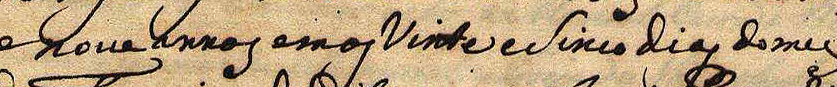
e noue annos em os Vinte e sinco dias do mes
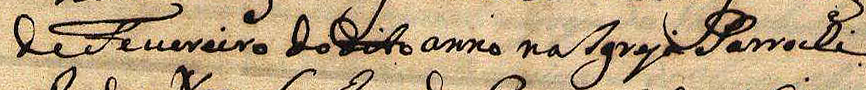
de Feuereiro do dito anno na Igreja Parrochi
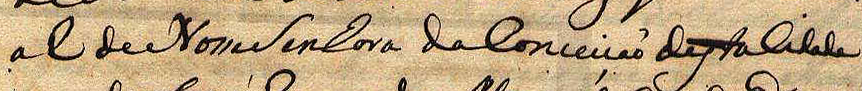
al de Nossa Senhora da Conceiçaõ desta Cidade
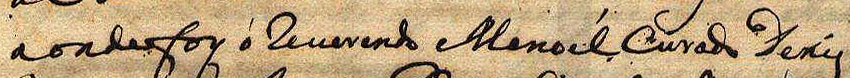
aonde foy o Reuerendo Manoel Curado Denis
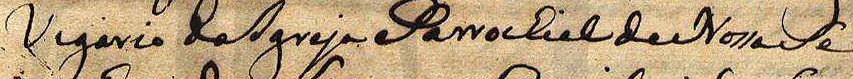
Vigario da Igreja Parrochial de Nossa Se
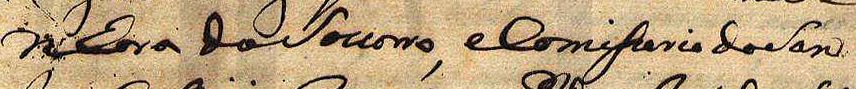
nhora do Soccorro, e Comissario do San
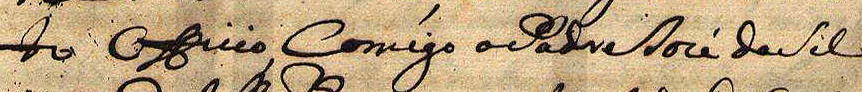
to Officio, Comigo o Padre Iozé da Sil
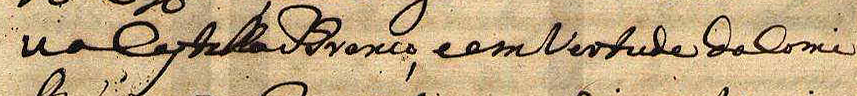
ua Castello Branco, e em Vertude da Comi
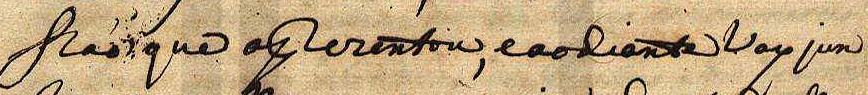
ssaõ que aprezentou, e ao diante Vay jun
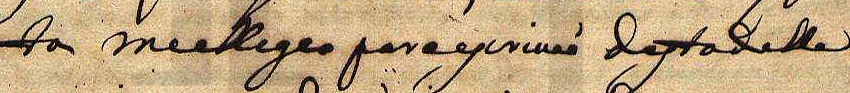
ta me ellegeo para escriuaõ desta delle
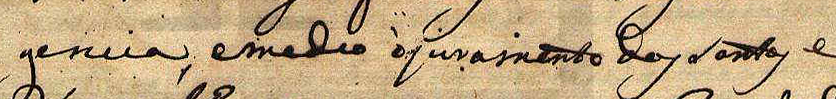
gencia, e me deo o juramento dos santos e
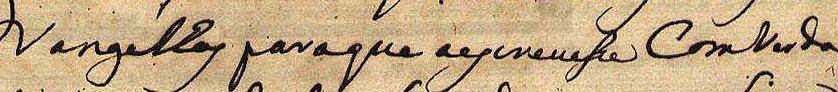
Vangelhos para que a escreuesse Com Verda
